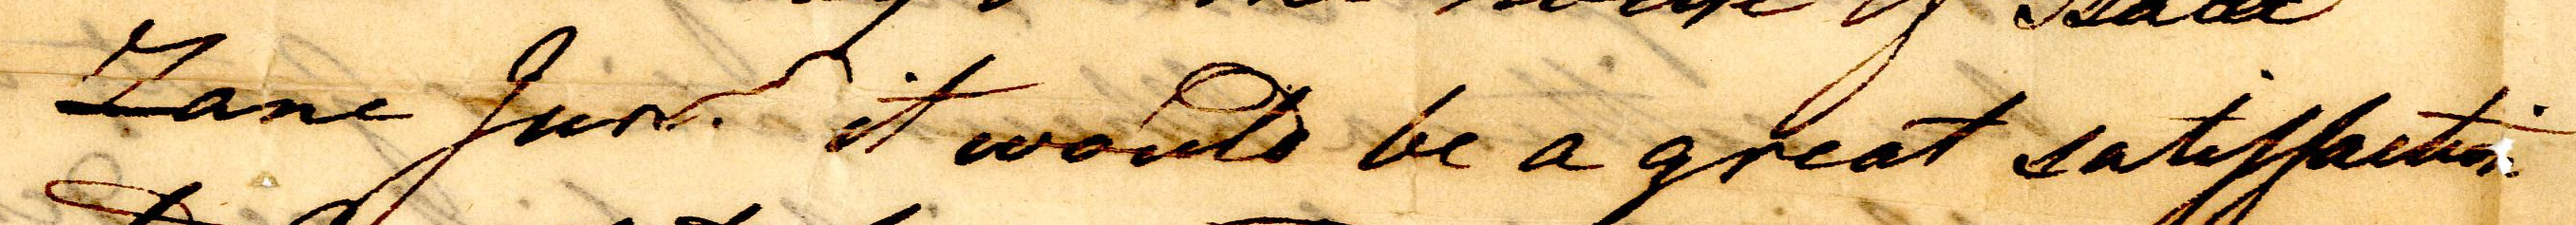Zane Jun^r. it would be a great satisfaction
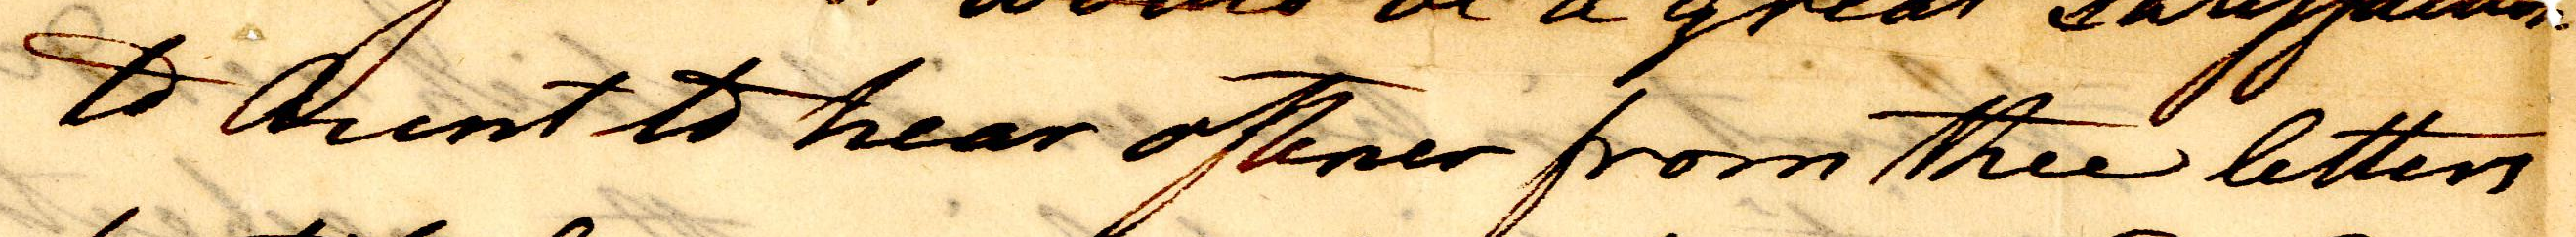to Aunt to hear oftener from thee letters
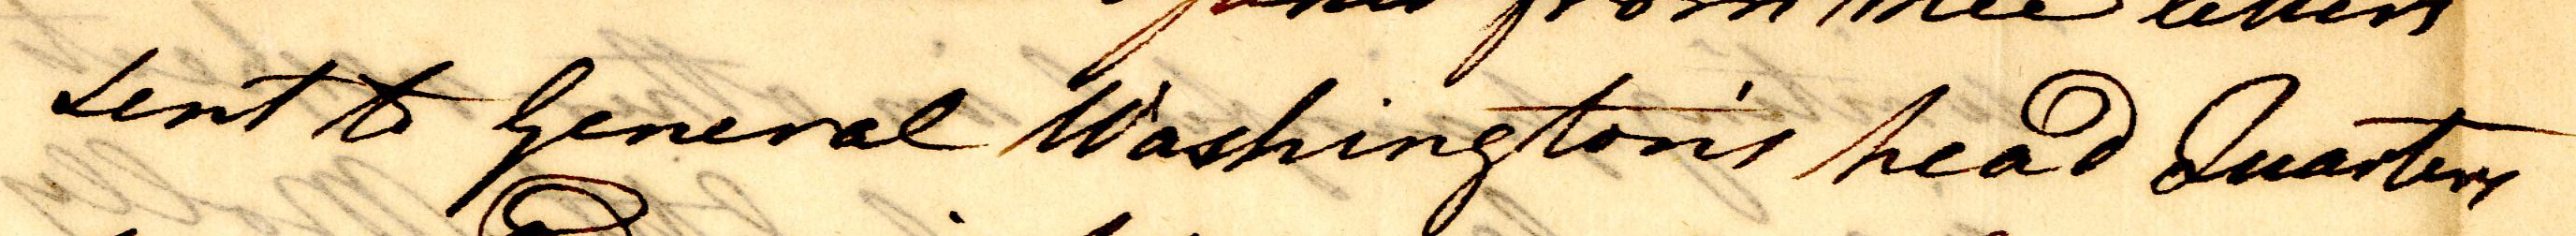sent to General Washington's head Quarters
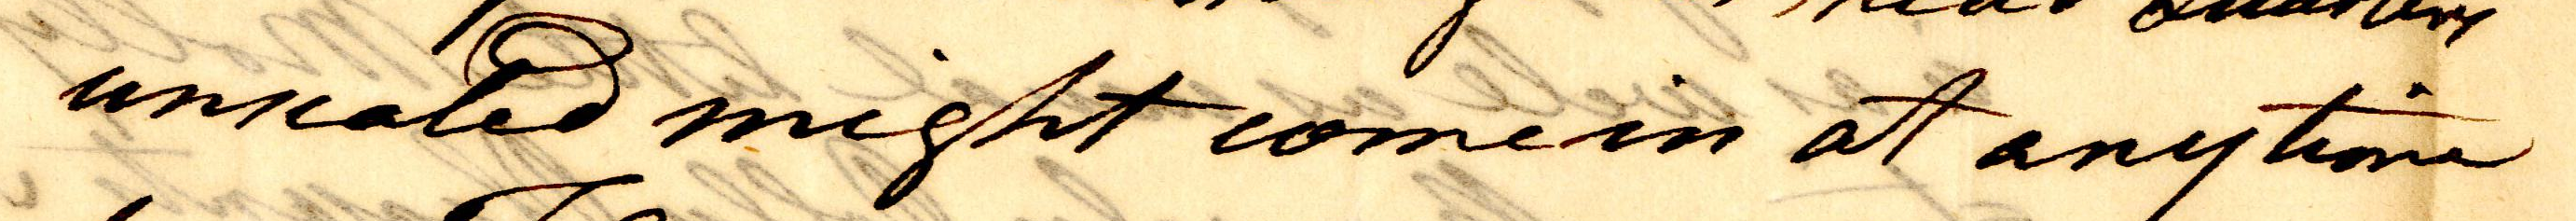unsealed might come in at anytime
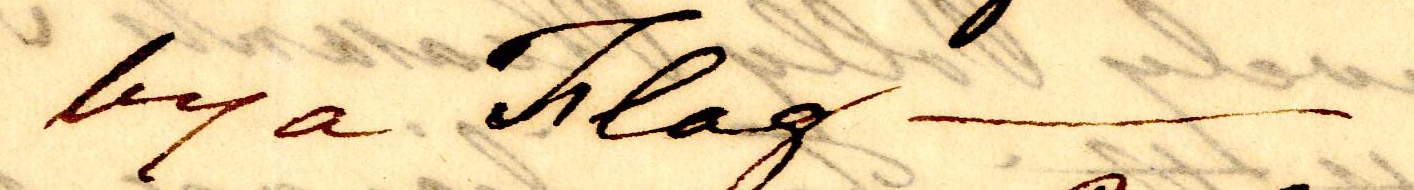by a Flag-
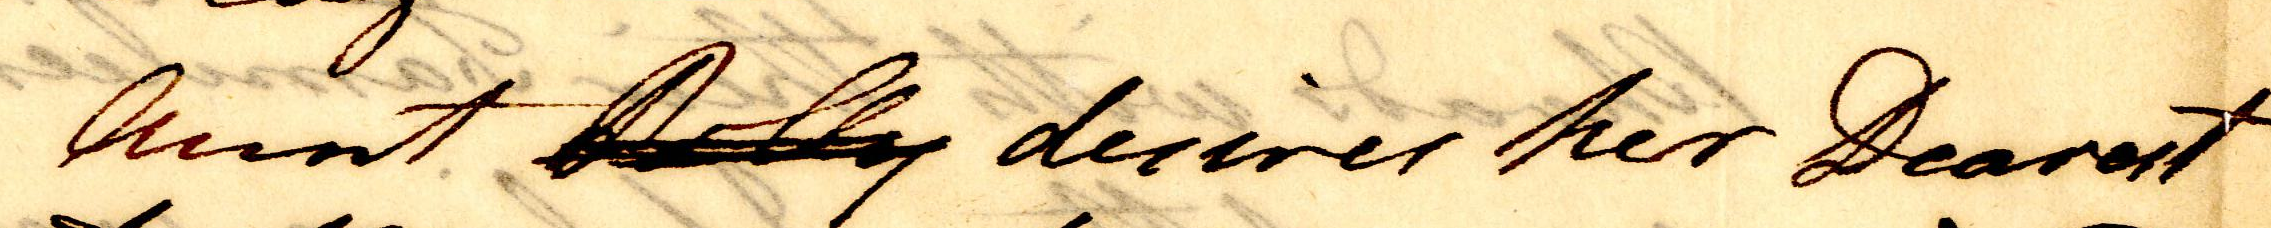Aunt [Polly] desires her Dearest
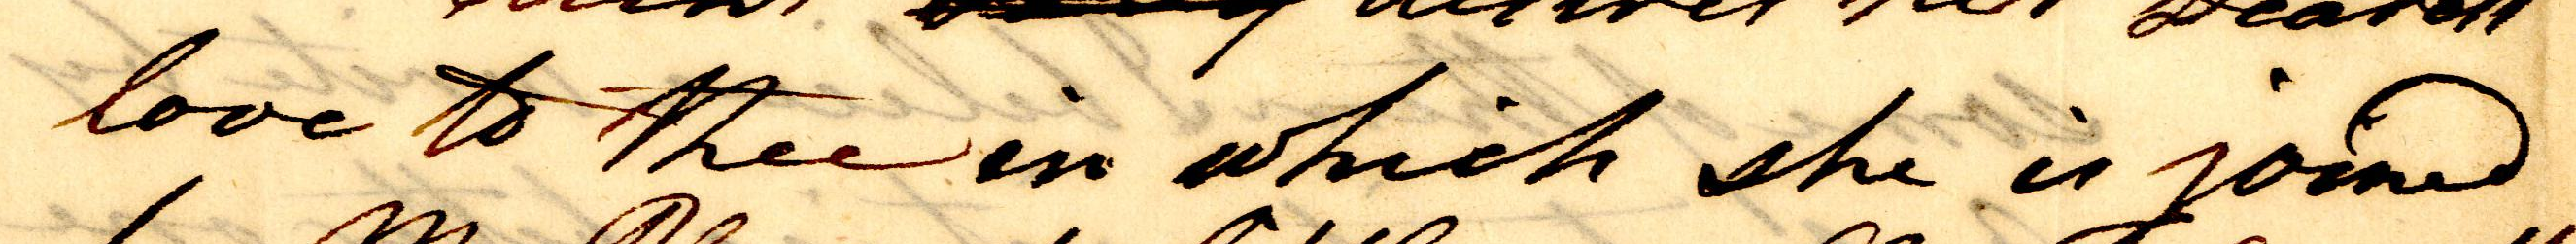love to thee in which she is joined
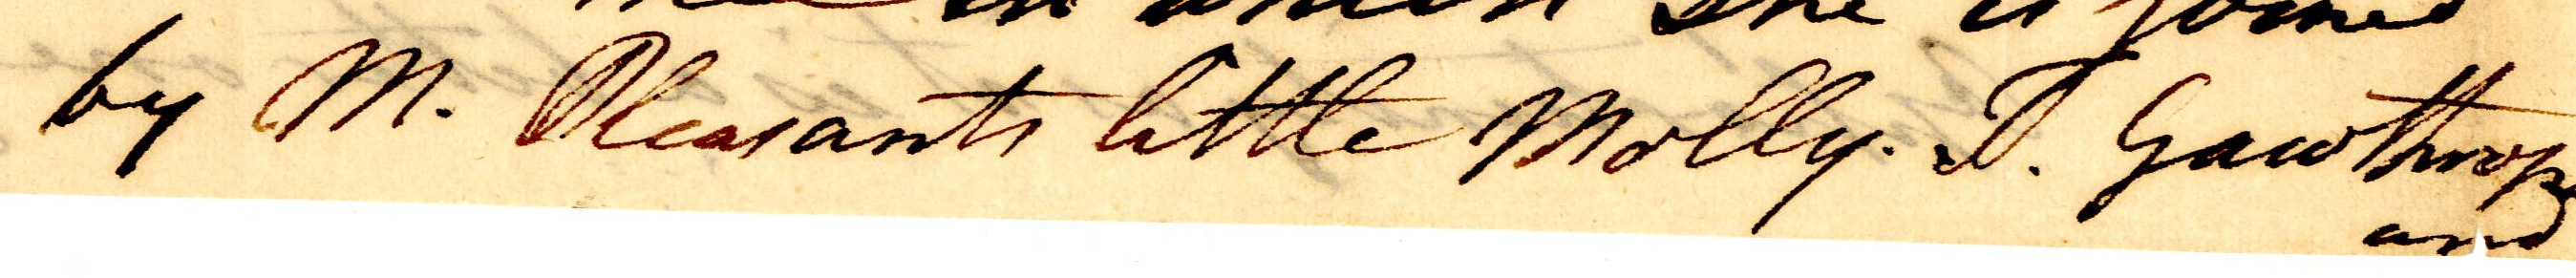by M. Pleasants little Molly T. Gawthrop
